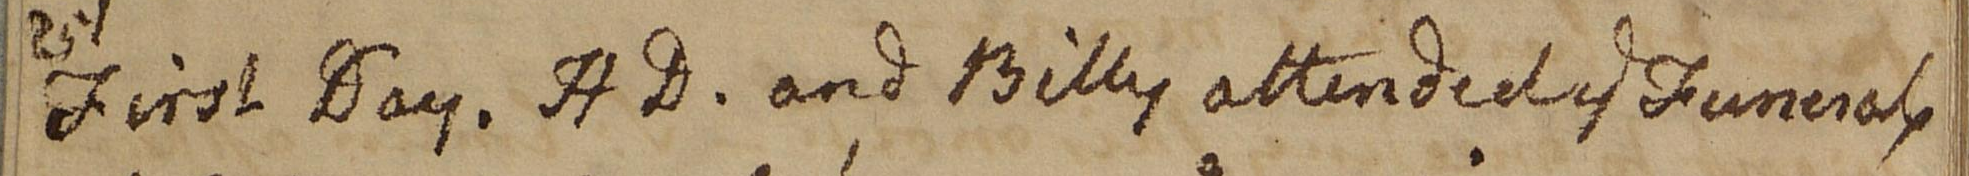First Day. HD. and Billy attended y^e Funeral
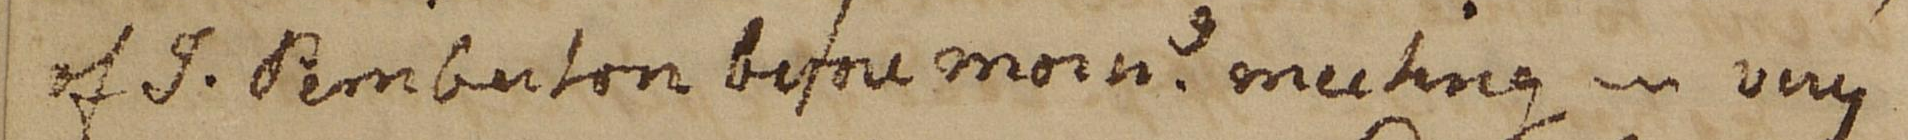of I. Pemberton before morn^g. meeting- very
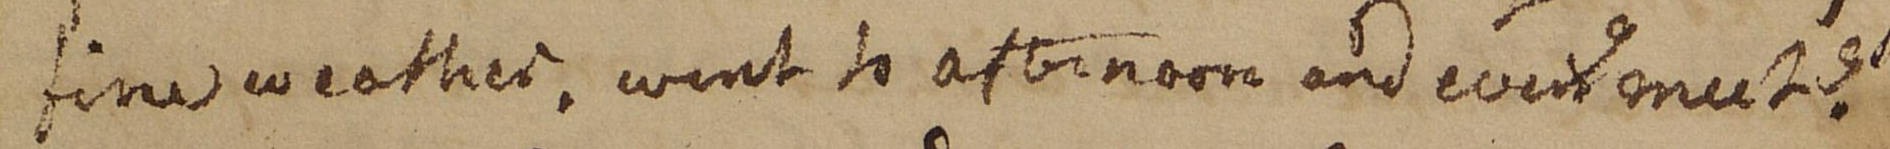fine weather, went to afternoon and even^g. meet^gs.
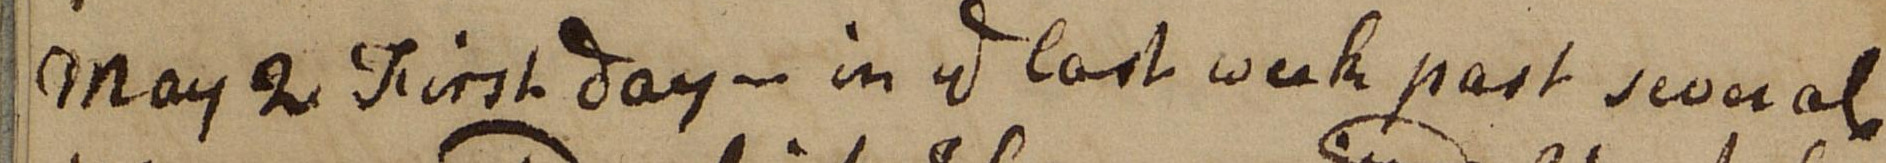May 2 First day- in y^e last week past several
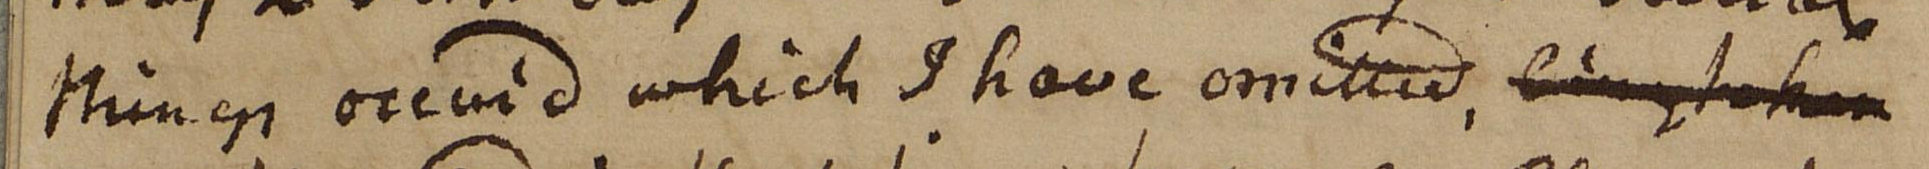things occur'd which I have omitted, [__________]
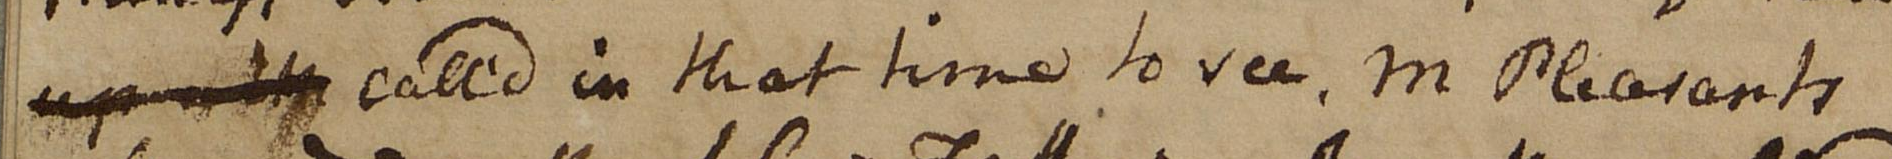[_____] call'd in that time to see, M Pleasants
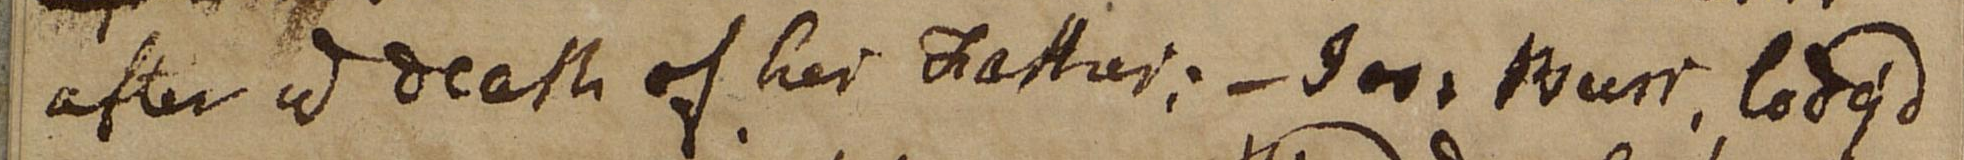after y^e death of her Father;- Jos: Burr, lodg'd
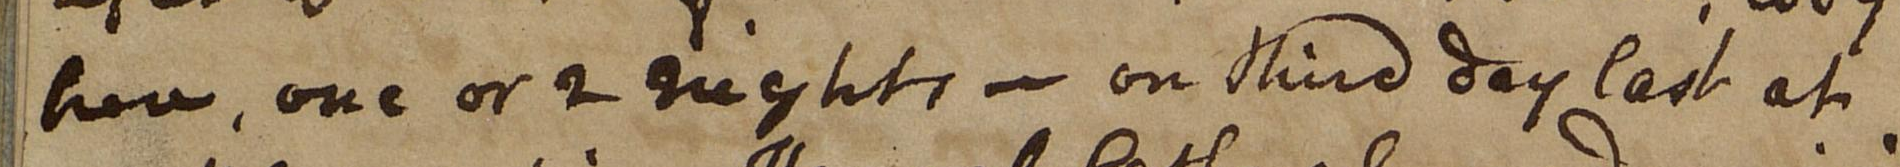here, one or 2 nights- on third day last at
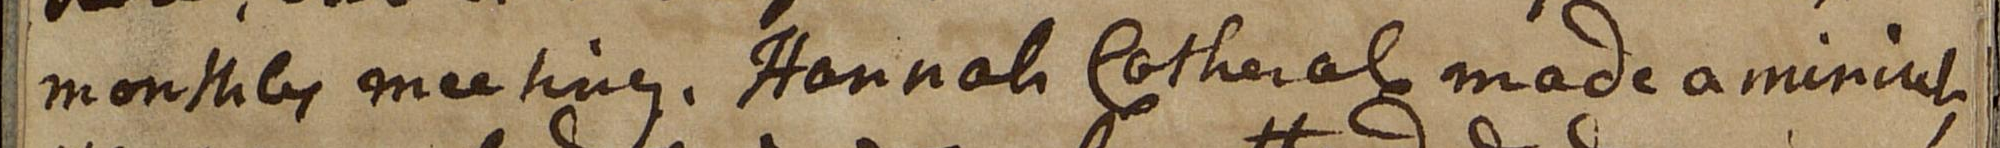monthly meeting. Hannah Catheral made a miniut,
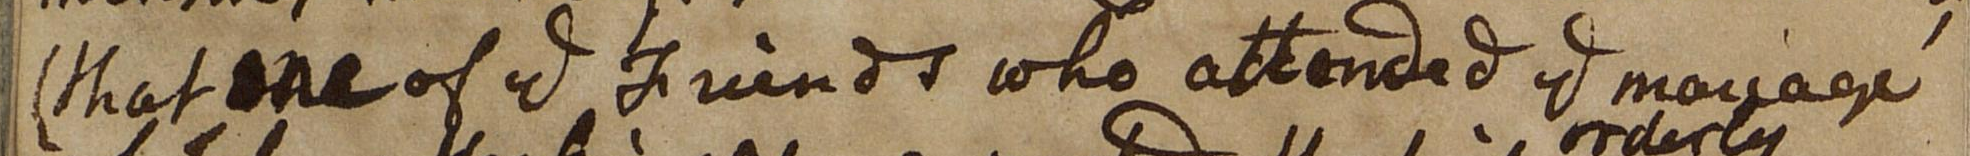(that one of y^e Friends who attended y^e marriage
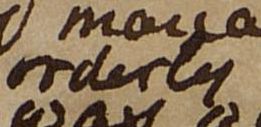orderly
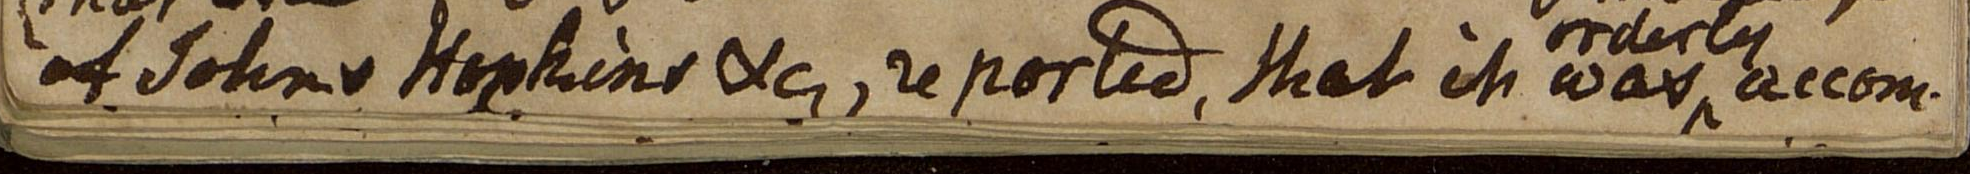of Johns Hopkins &c, reported, that it was ^ accom-
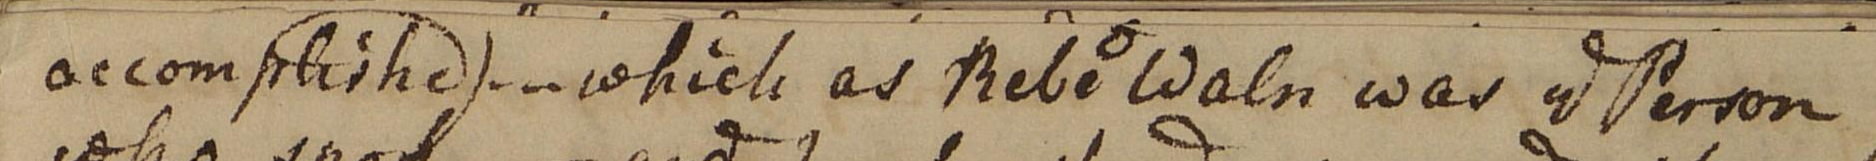accomplish'd)-which as Reb^a. Waln was y^e Person
